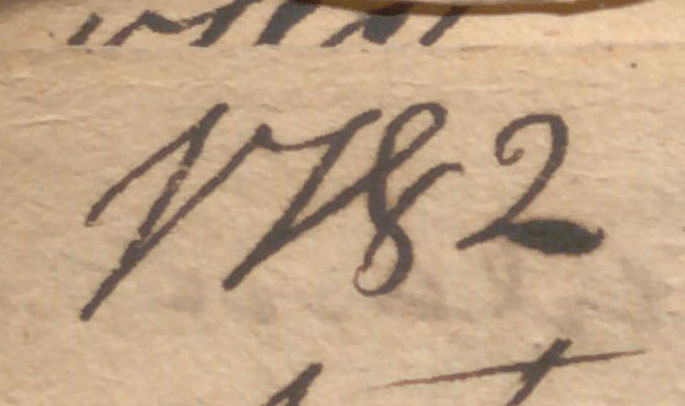1782
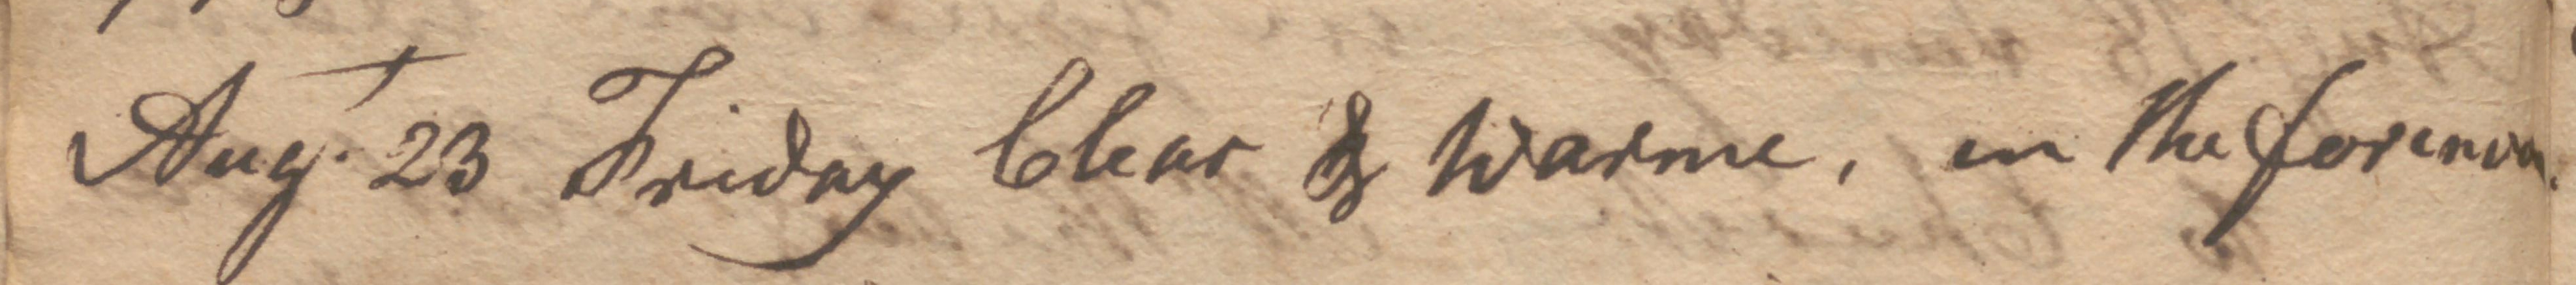Aug^t. 23 Friday Clear & Warme, in the forenoon
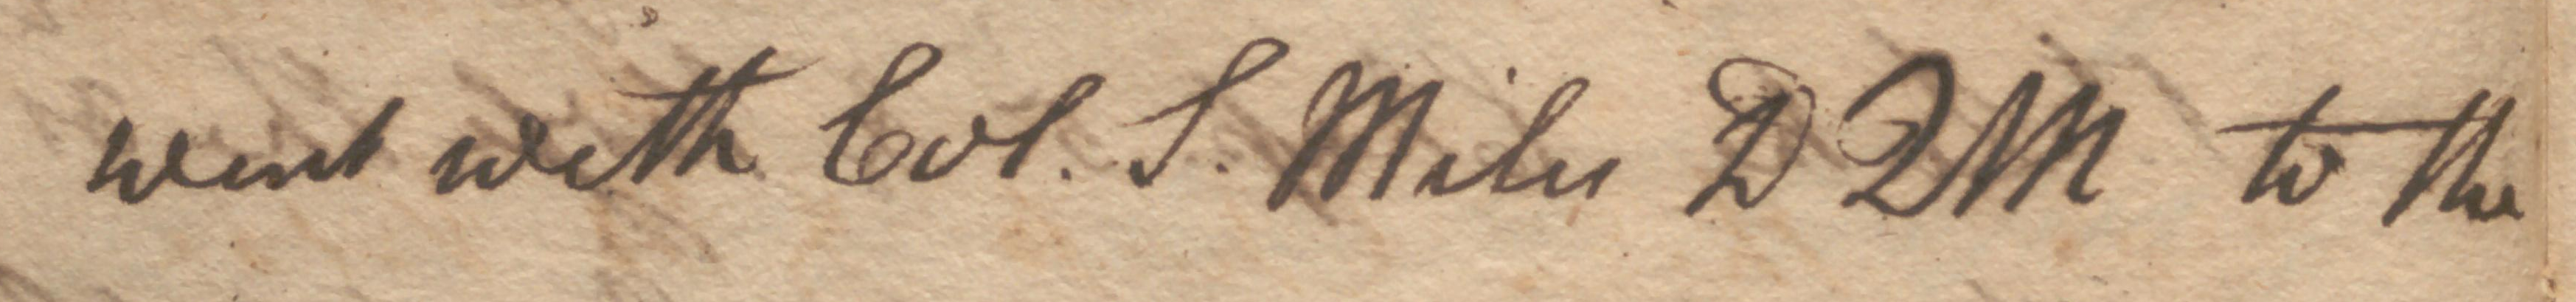went with Col. S. Miles DQM to the
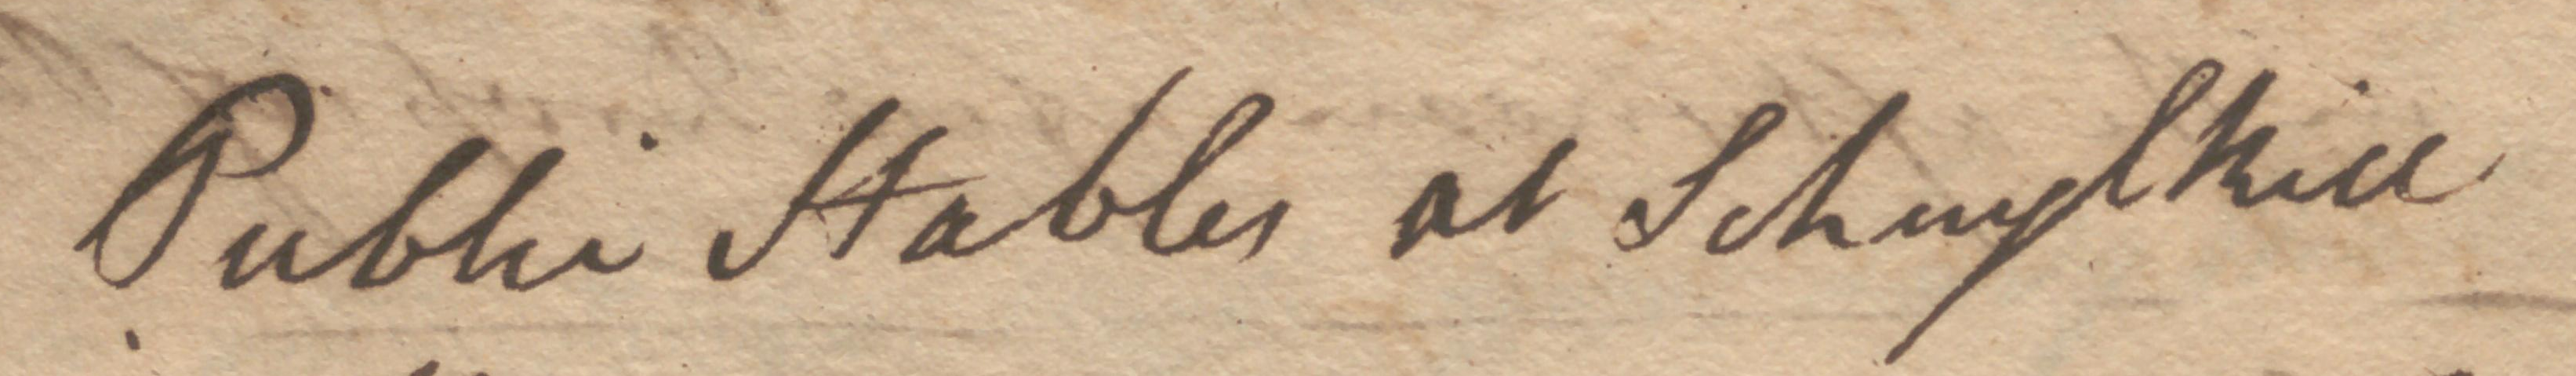Public Stables at Schuylkill
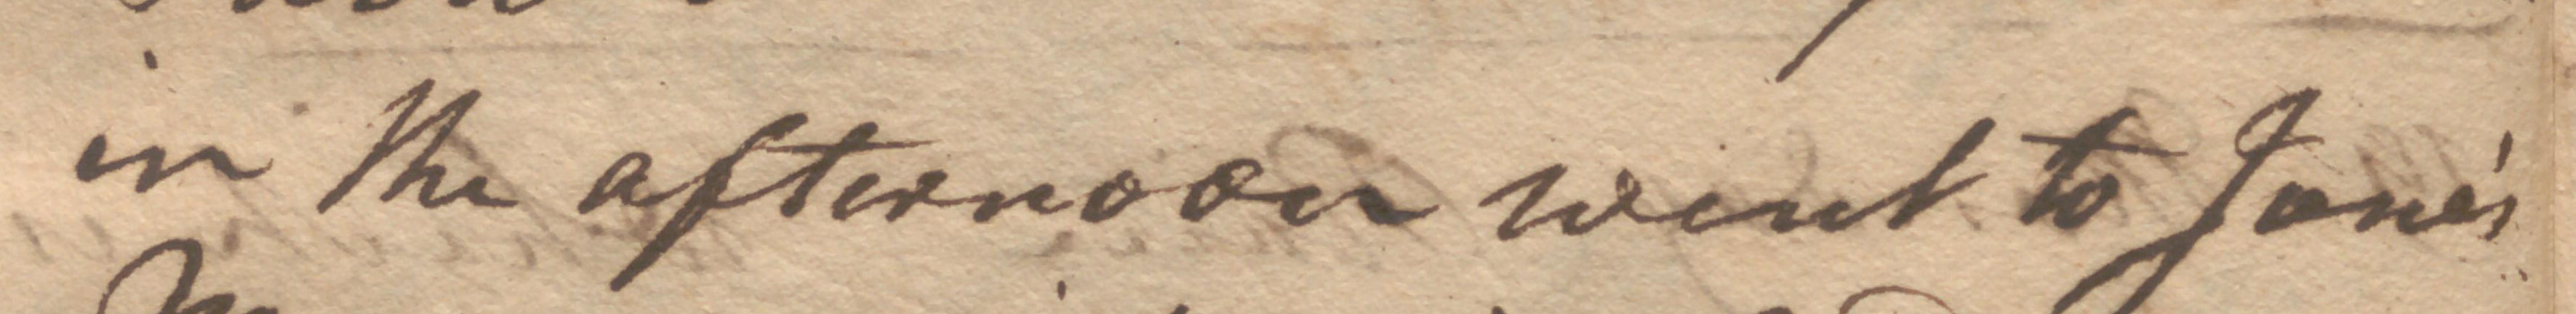in the afternoon went to Jone's
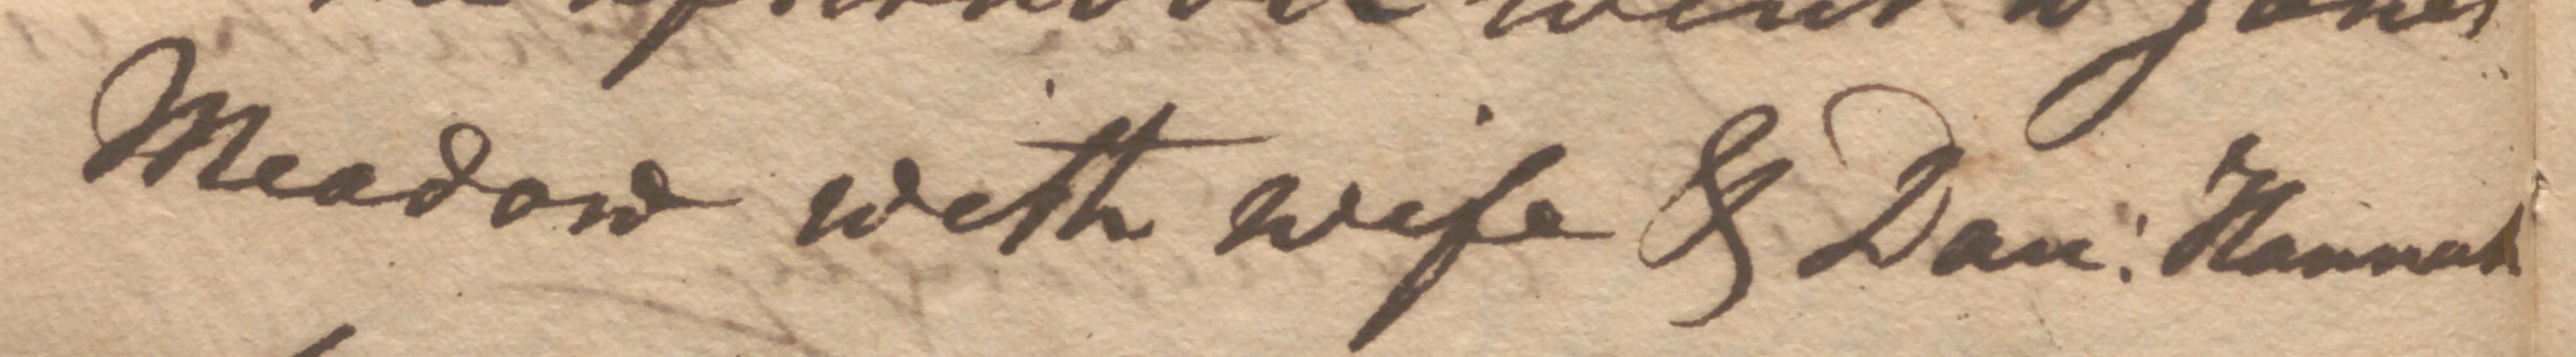Meadow with wife & Dau: Hannah
